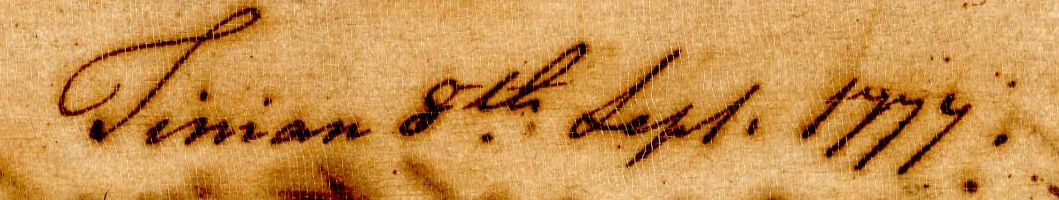Tinian 8^th. Sept. 1777.
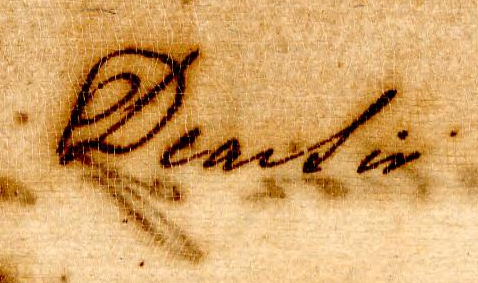Dear Sir
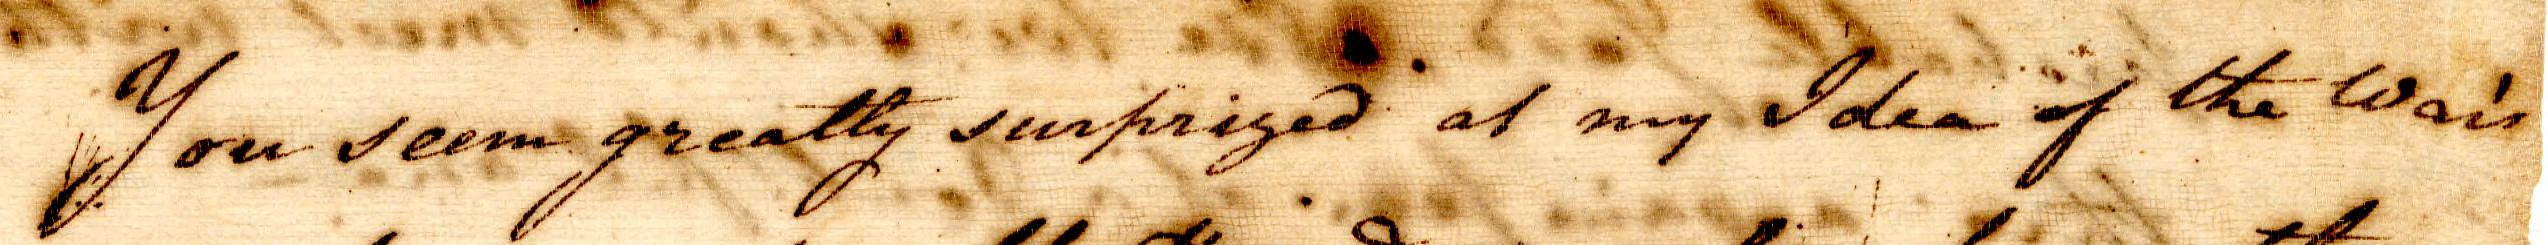You seem greatly surprized at my Idea of the War's
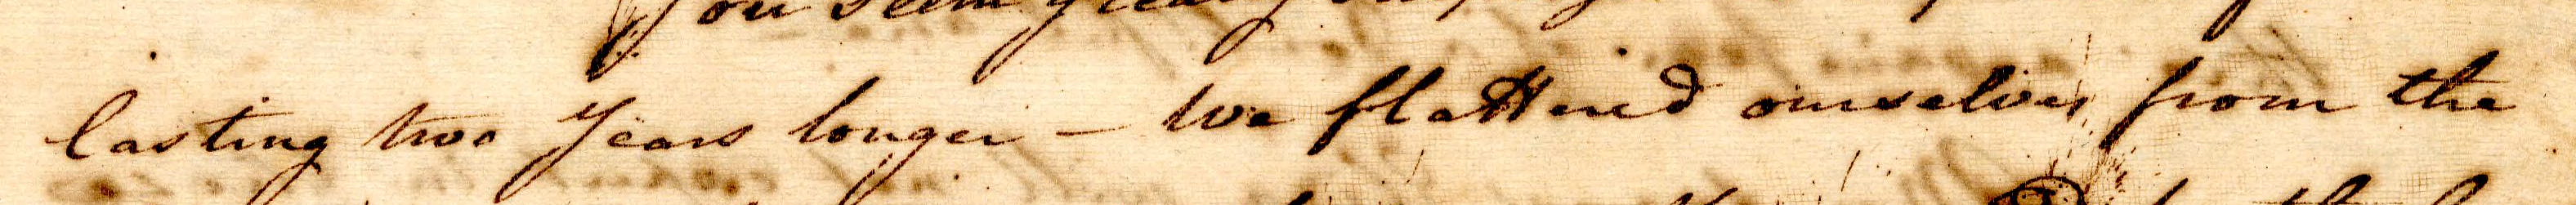lasting two Years longer- We flattered ourselves from the
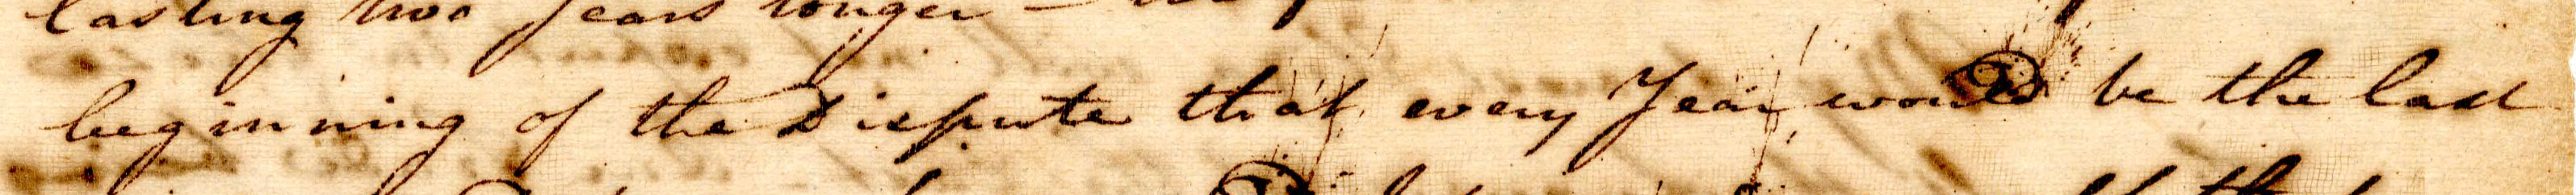beginning of the Dispute that every year would be the last
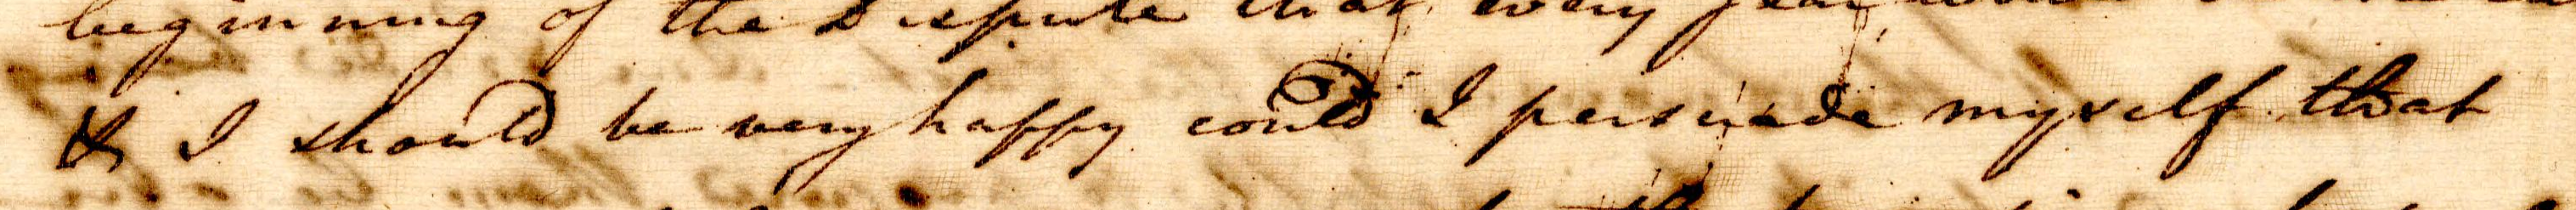& I should be very happy could I persuade myself that
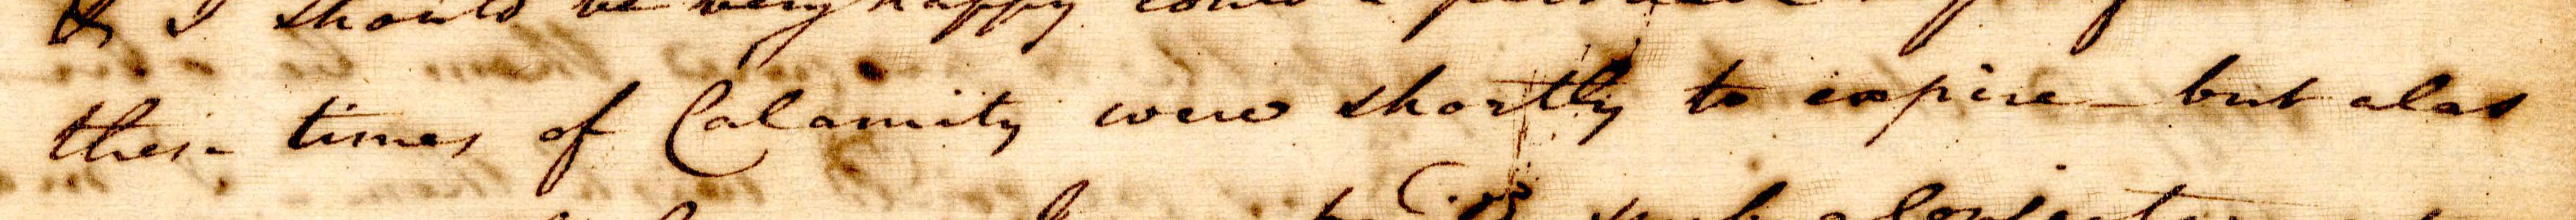these times of Calamity were shortly to expire- but alas
